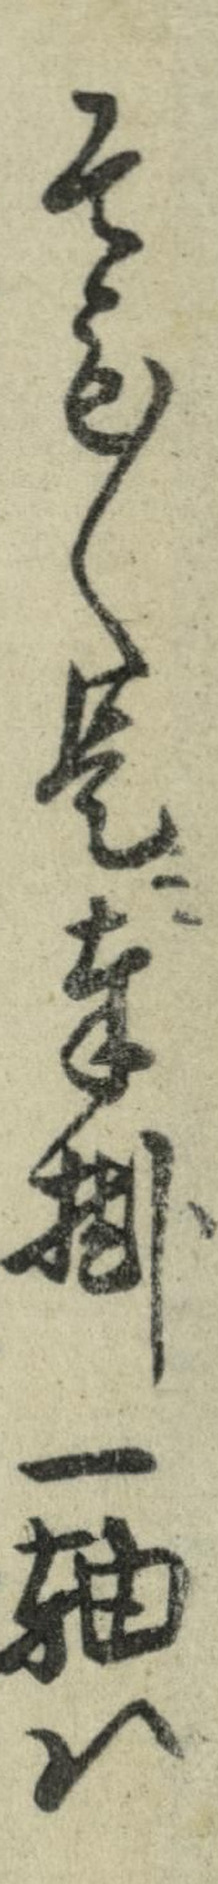そも〳〵是ニ奉掛一軸ハ
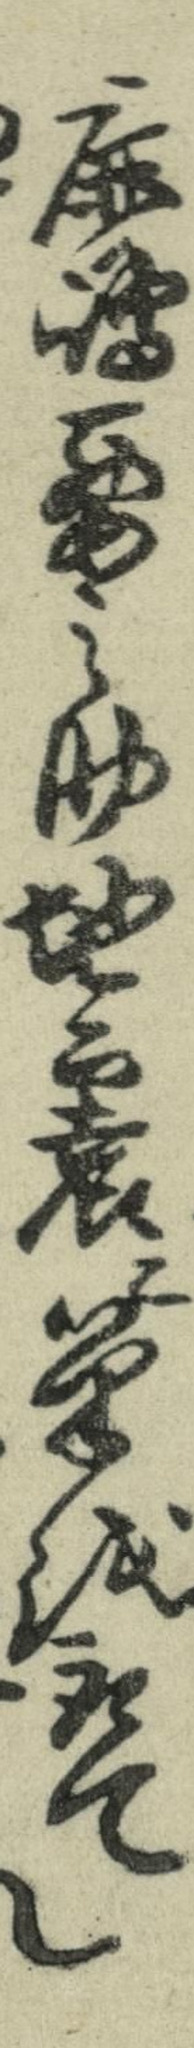鹿嶋要之助地震ニ筆を取て
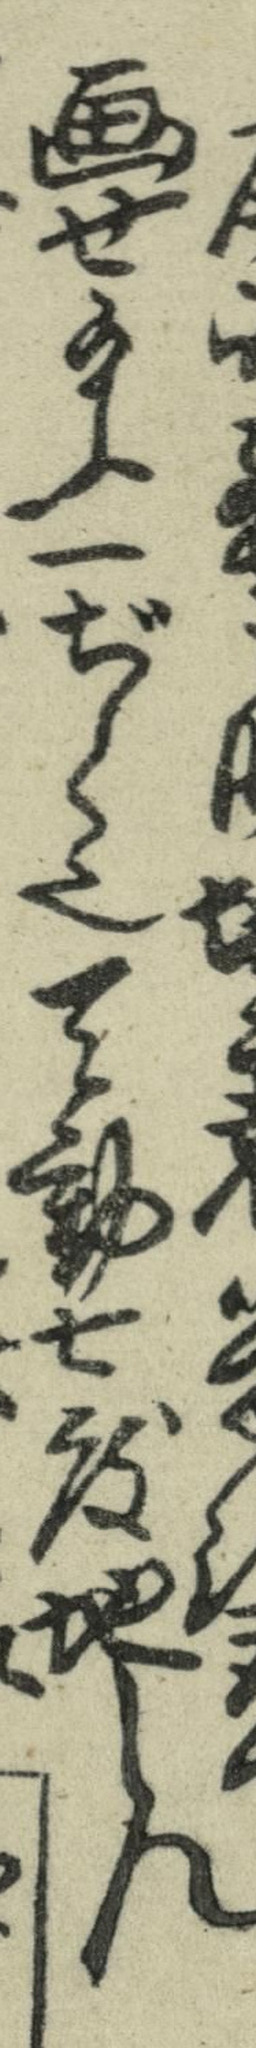画せ給ふ一ぢく也天動七度地しん
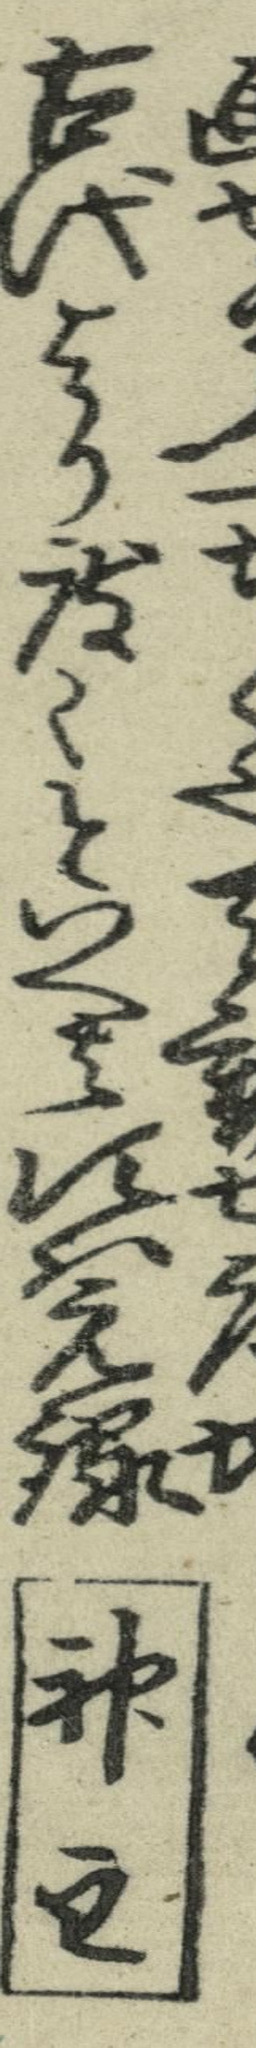古代より度々といへば頃ハ元禄
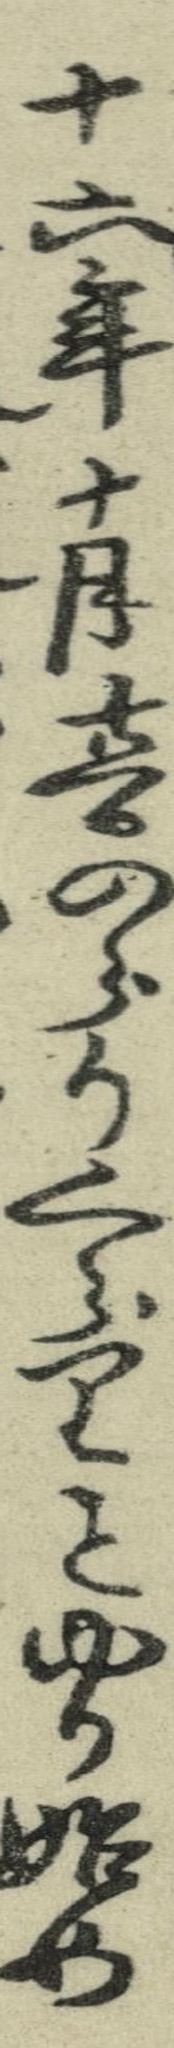十六年十月廿一日のらりくらりとゆり始め
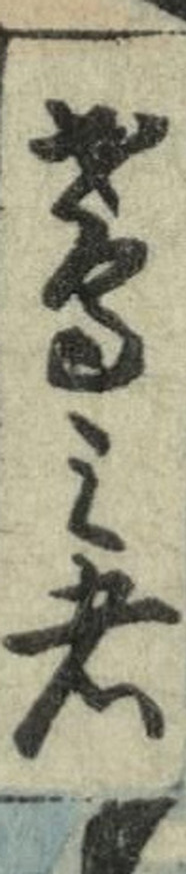鳶之者
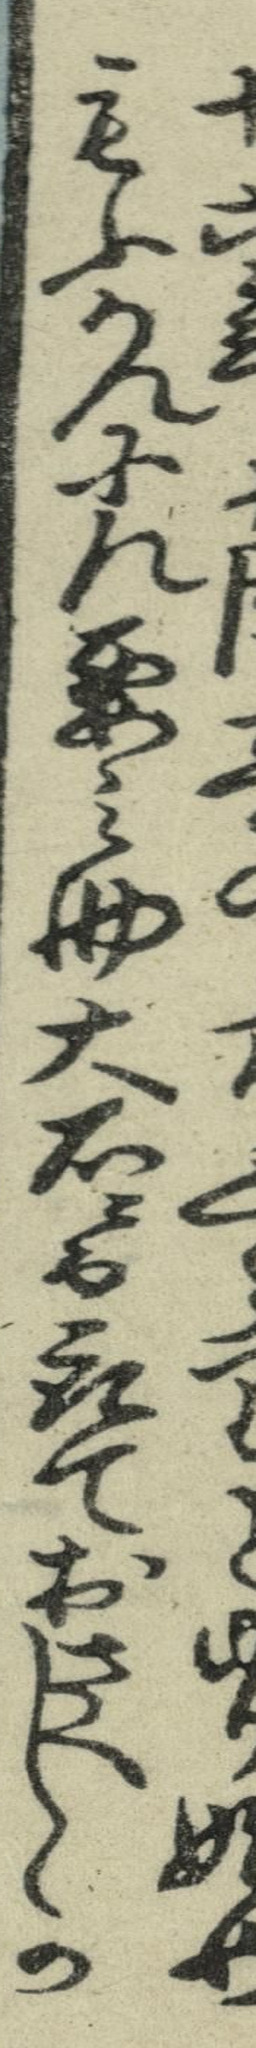もうかんにん要之助大石ニ而取ておさへしか
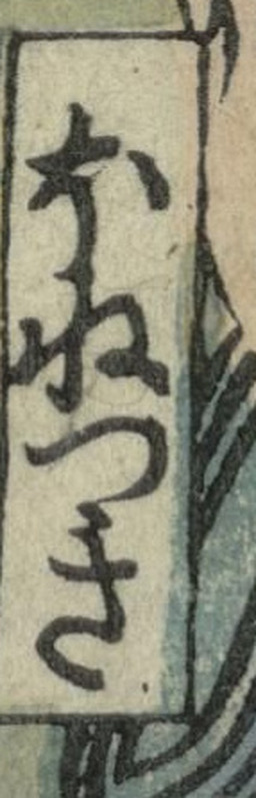ほねつき
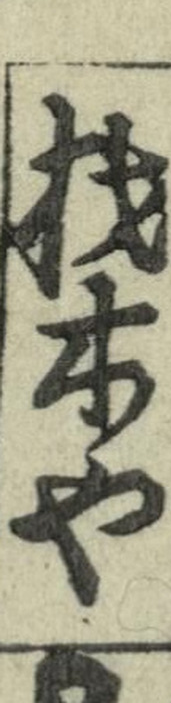材木や
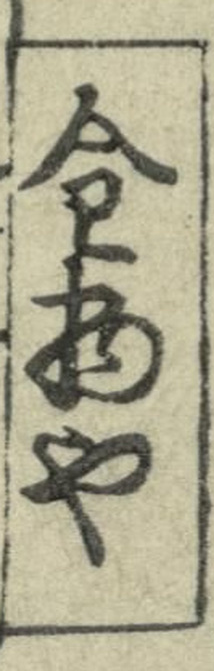金物や
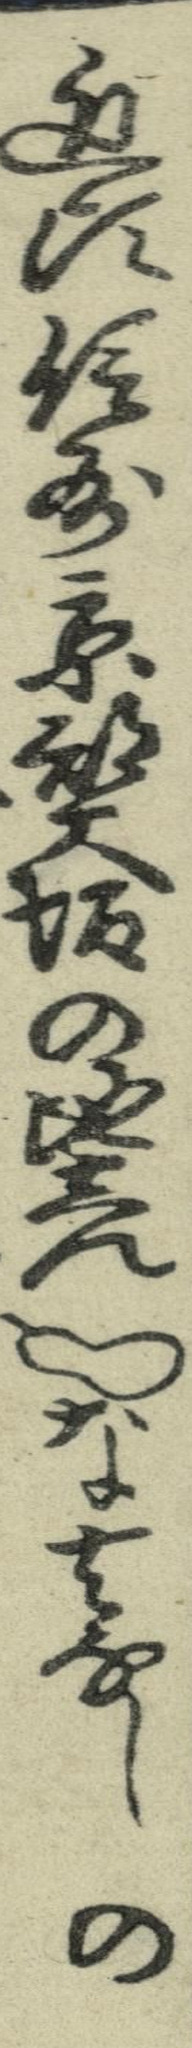近頃信州京都大坂の地しんなはなしの
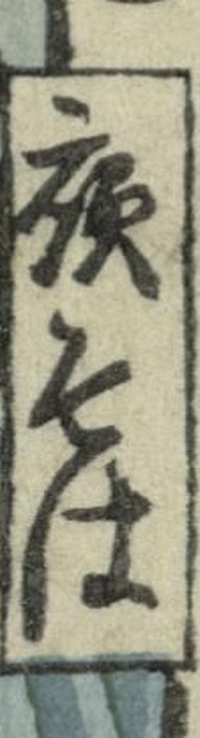夜そは
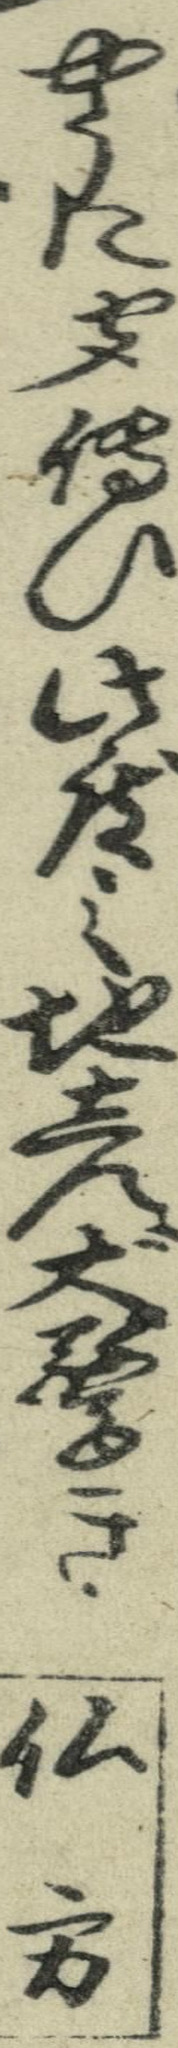やうに聞伝ひ此度之地しんニ大驚き
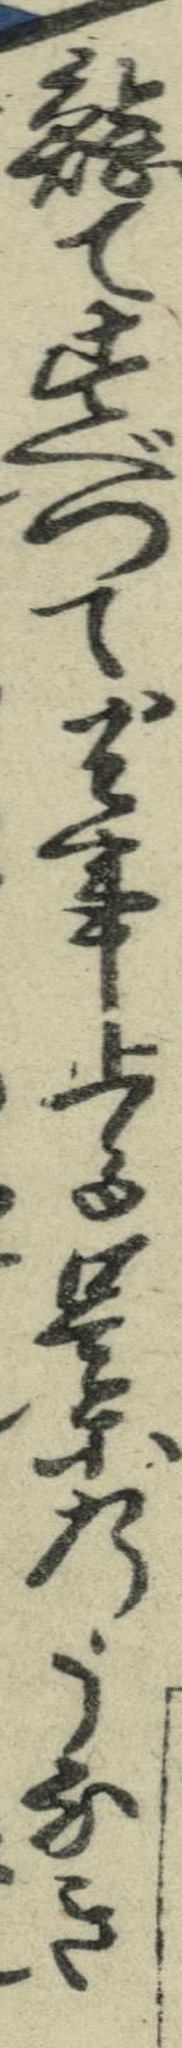鮨てすべつて火事上る是等のうなき
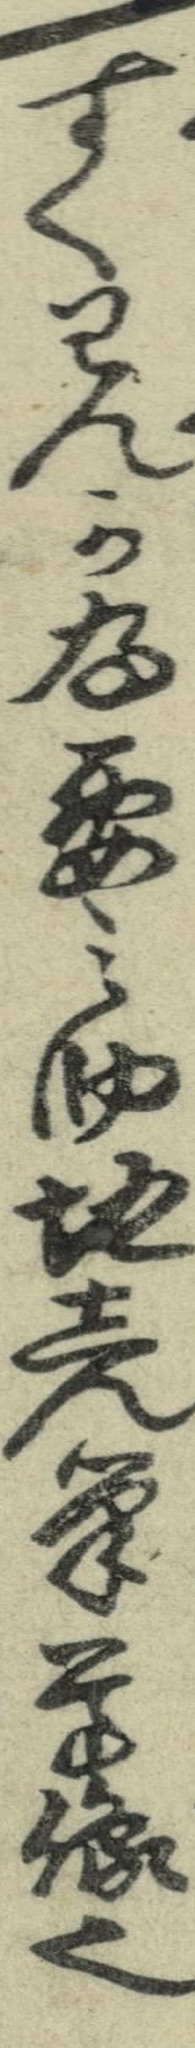すくわんか為要之助地しん筆尊像也
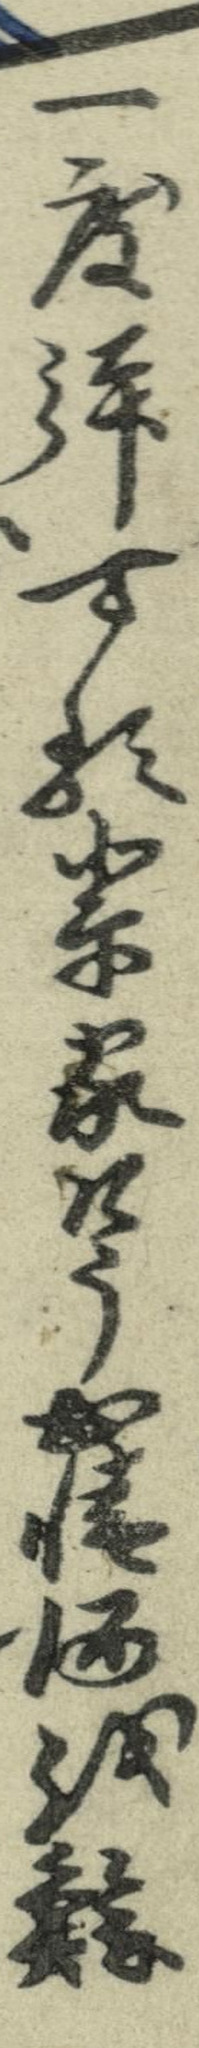一度拝する輩家けう出精酒を鮨
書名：[鯰の掛軸]
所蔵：東京大学地震研究所図書室 Earthquake Research Institute Library, The University of Tokyo, JAPAN
